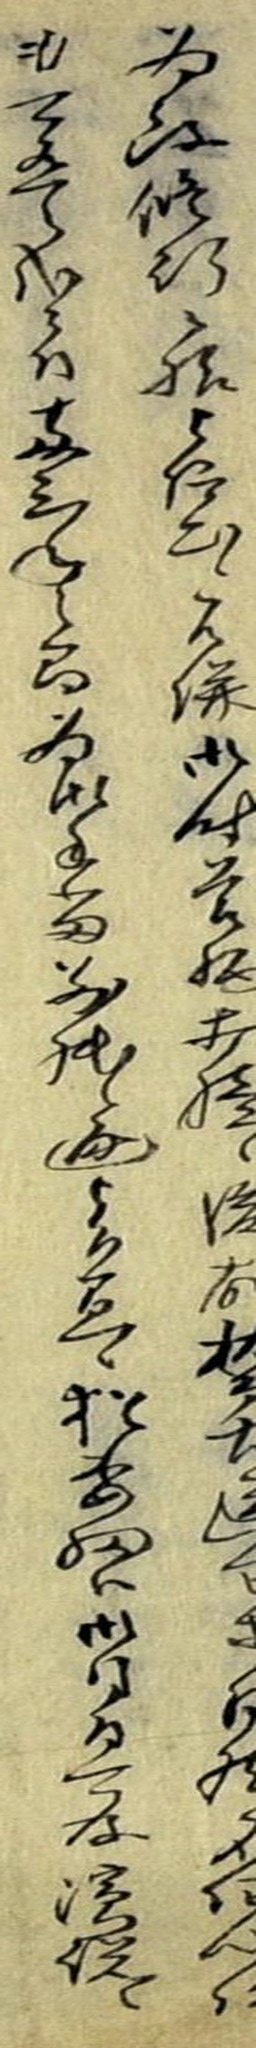も可有之哉に付両三年之間為御手当別紙之通被下置候猶委細は御目付可及演説候
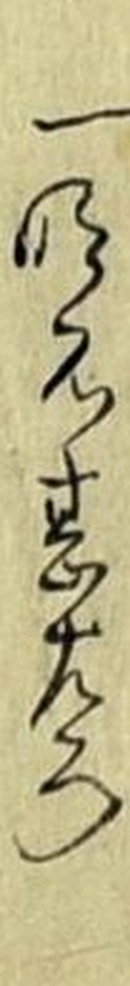一墨明石甚左衛門
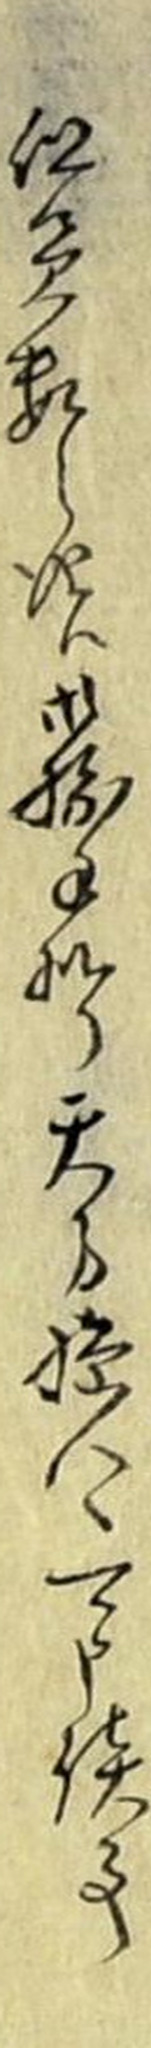但員数之儀は御勝手掛り天方孫八へ可申談事
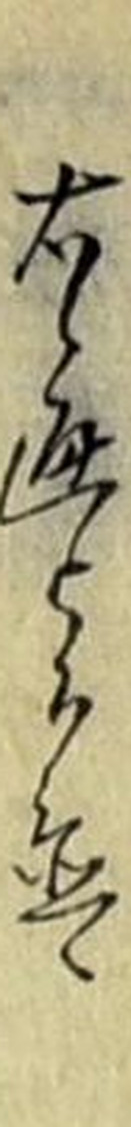右之通被下置候

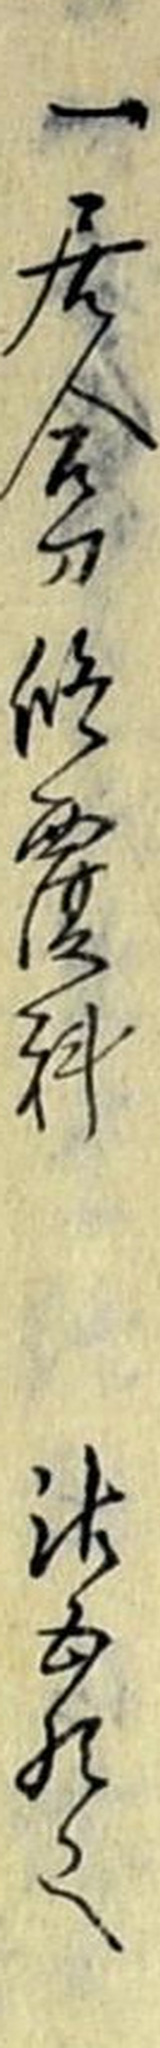一居合刀修覆料銀五拾匁
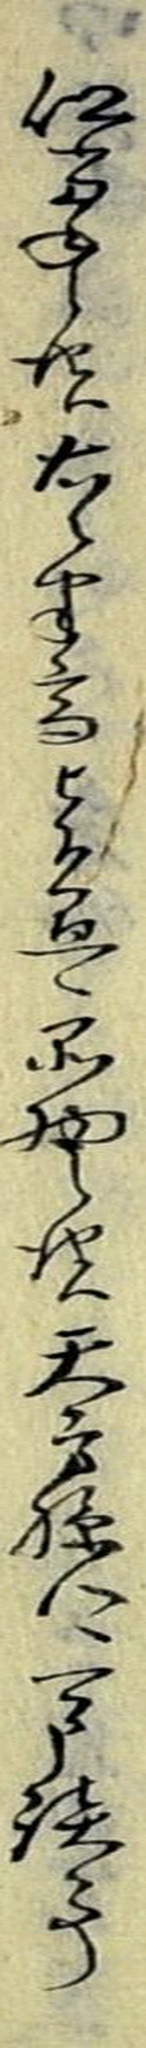但当年之儀は右之半高被下置候品物之儀は天方孫八へ可申談事
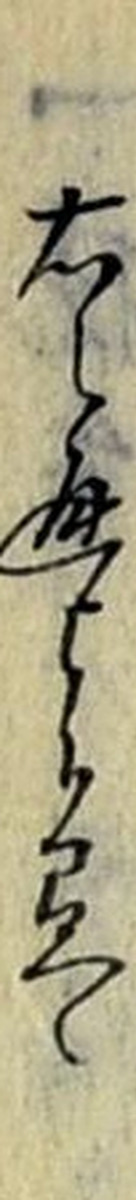右之通被下置候
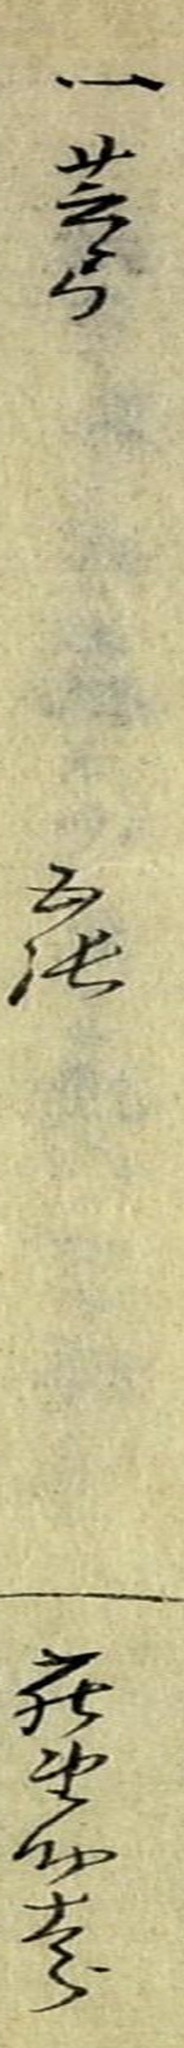一芸弓五張荻野助太郎
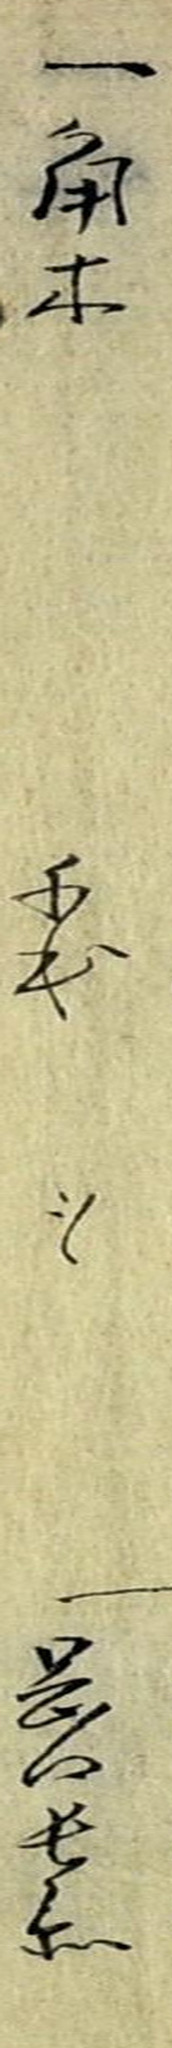一角木千本つヽ岡田長兵衛
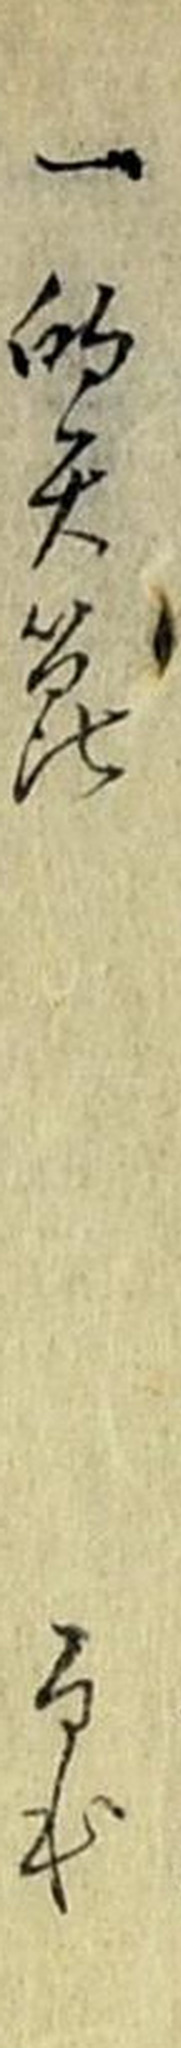一的矢箟百本
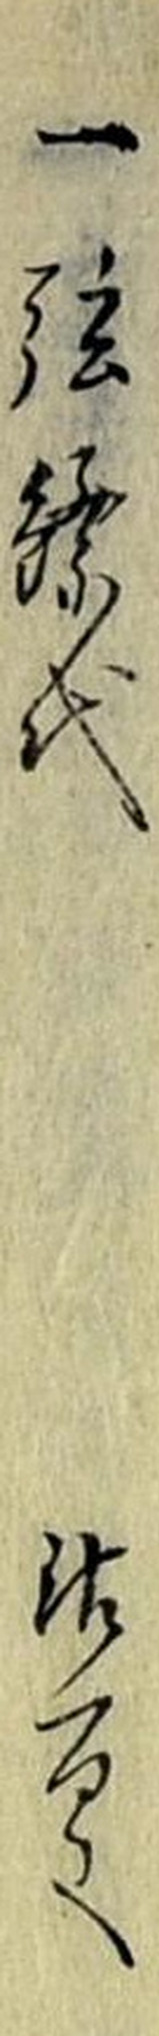一弦鰾代銀百匁
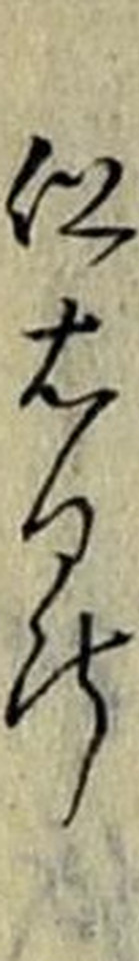但右同断
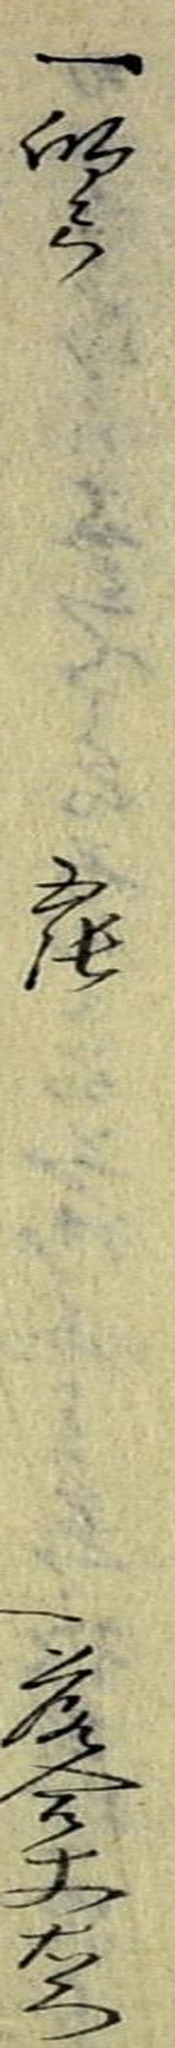一的弓五張落合丈右衛門
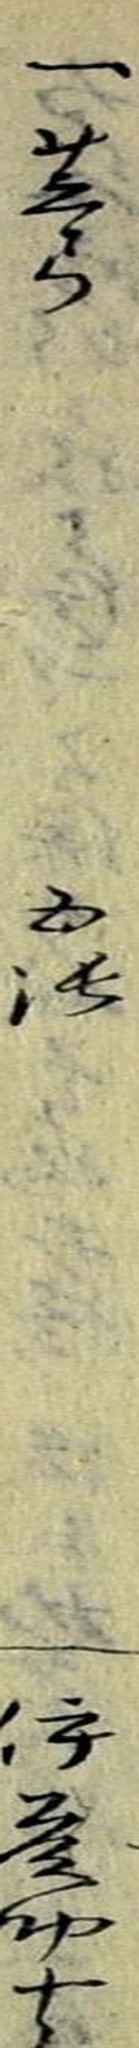一芸弓五張伊藤助十郎
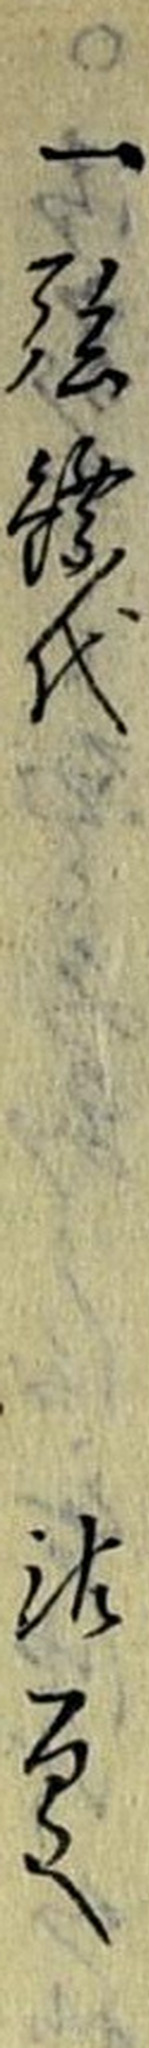一弦鰾代銀百匁
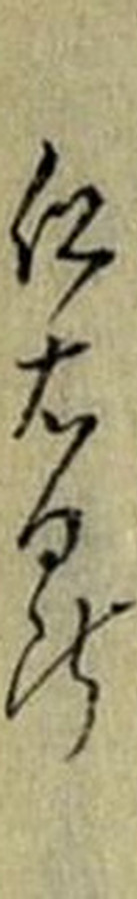但右同断
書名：命令之部 六
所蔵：福井県文書館 Fukui Prefectural Archives
